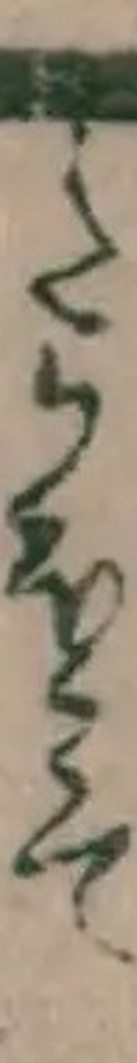たかほにて
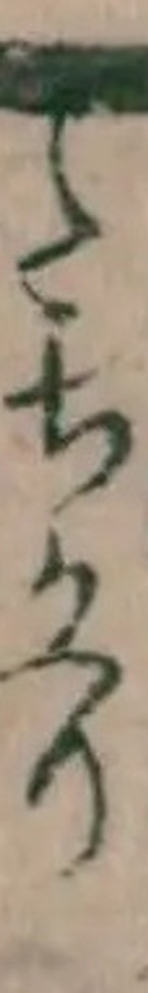たちかへり
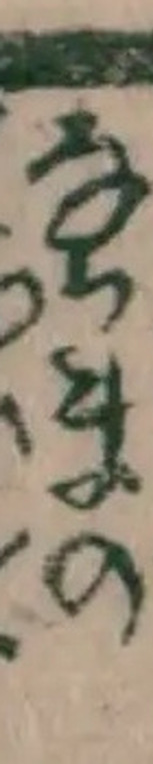なかまの
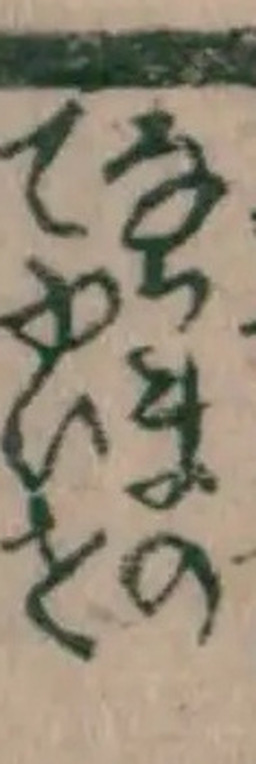てやいを
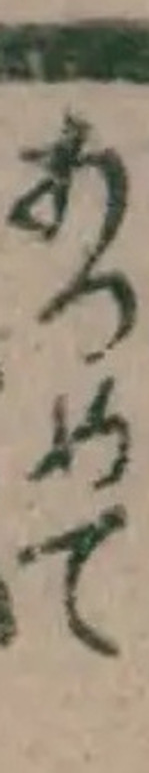あつめて
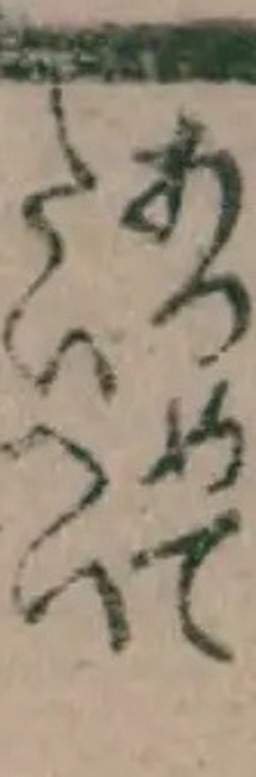たいへい
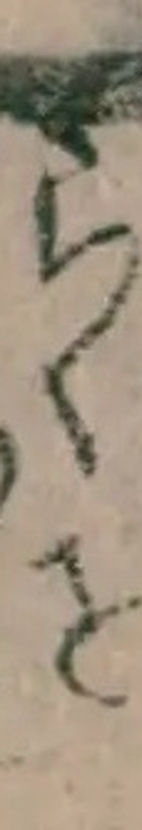らくを
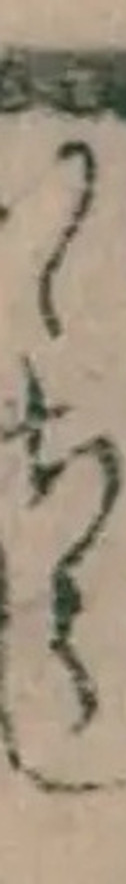いゝちらし
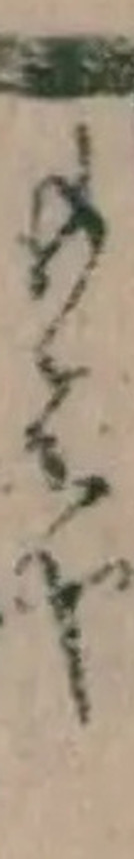もはや
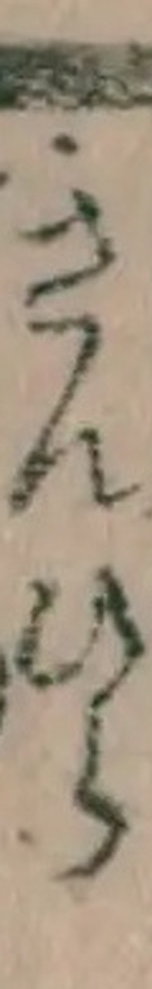きんひら
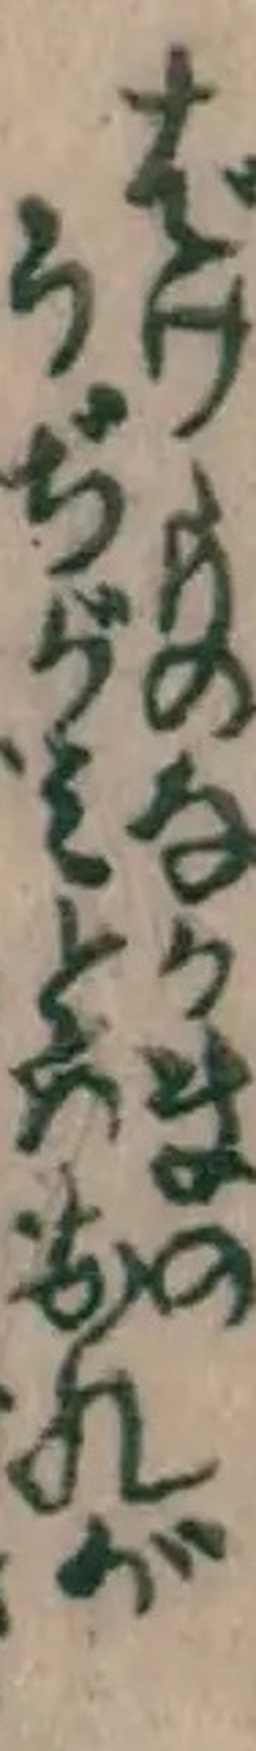うぢがみとはおれが
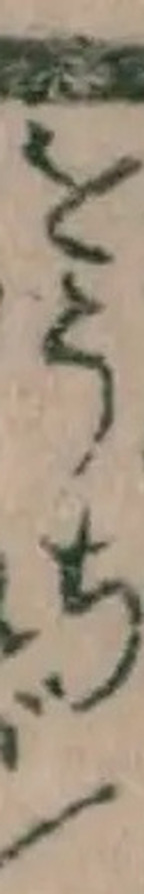をうち
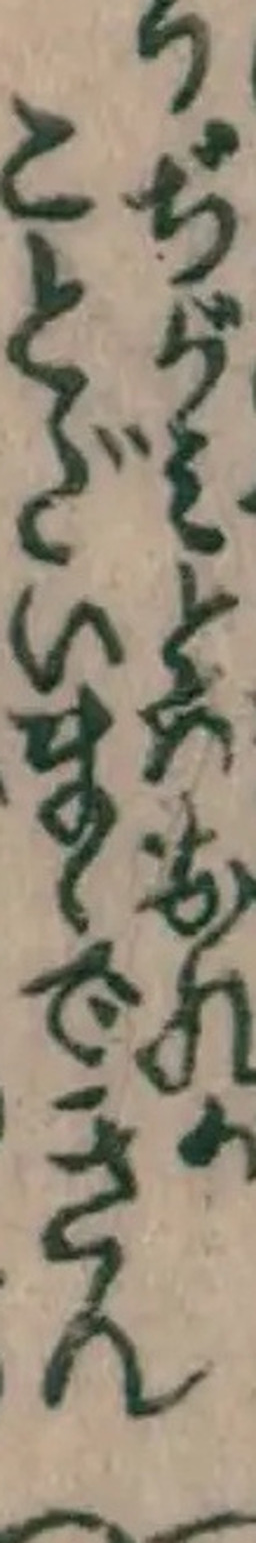ことだいまゝできん
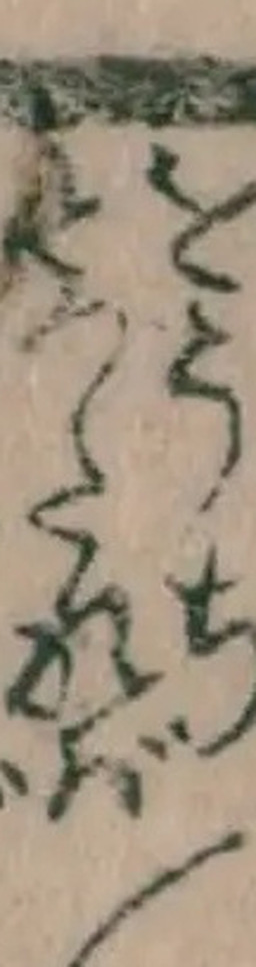とつたれば
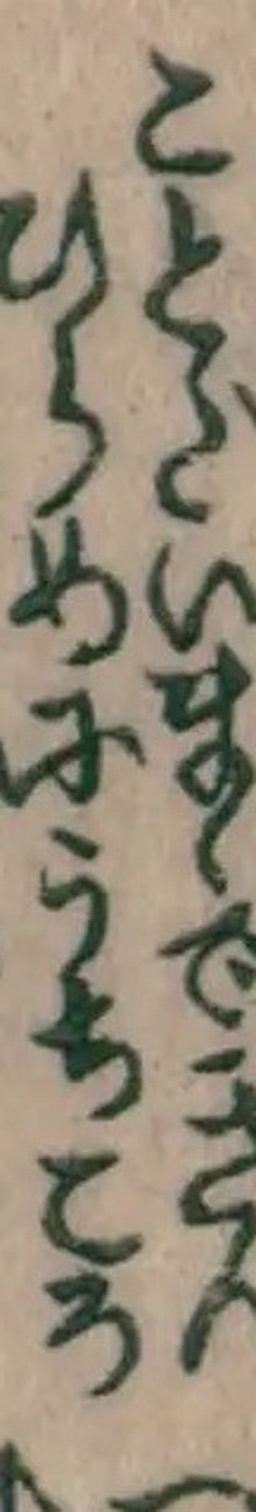ひらめにうちころ
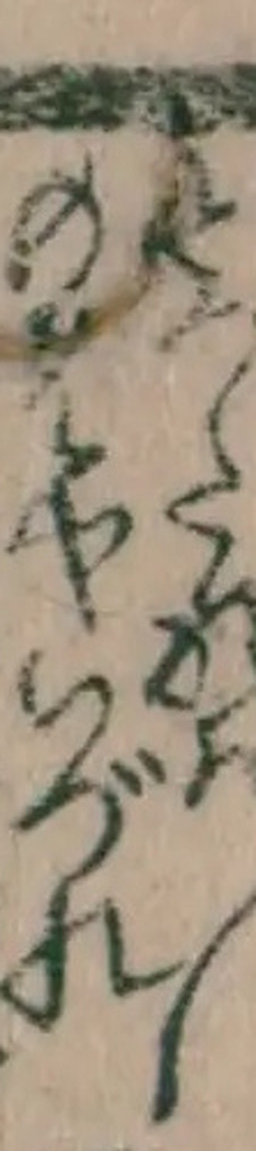もはやいづれ
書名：信有奇怪会
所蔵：国立国会図書館 National Diet Library, JAPAN
